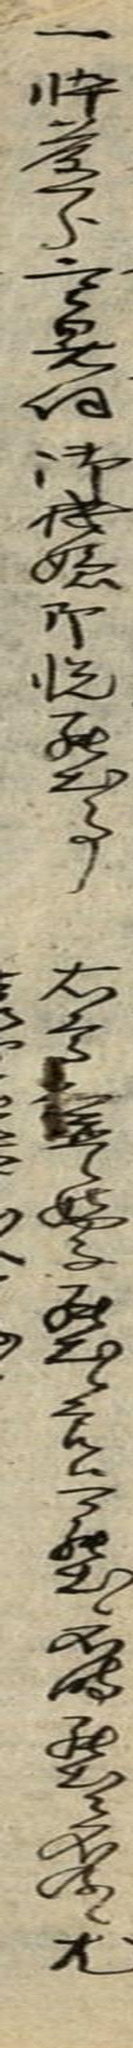一忰藤一郎寒暑伺御機嫌御悦罷出候事右之嫡子罷出候節は可罷出候不時罷出に不及候尤
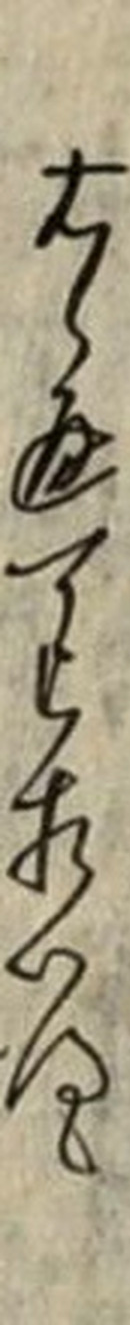右之通可被相心得候
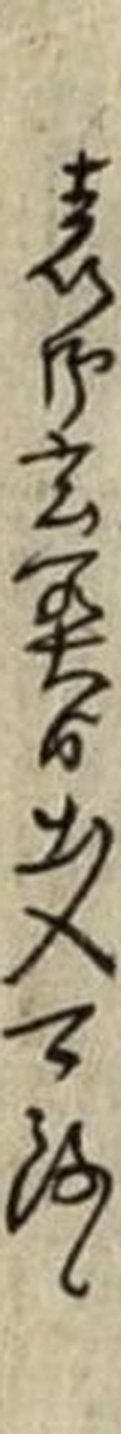表御玄関ゟ出入可致候
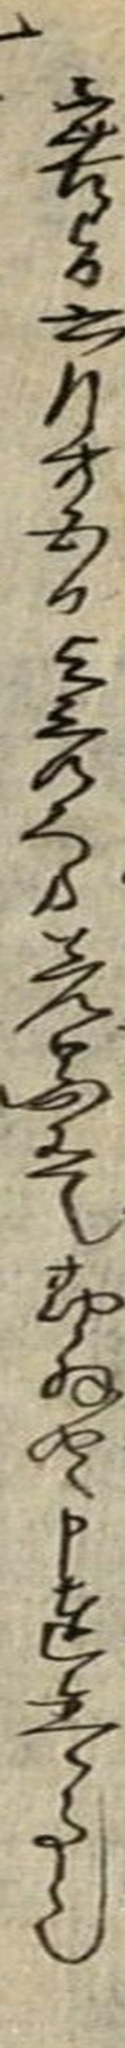不苦旨六月廿五日与三左衛門方差図有之勘解由へ申達置候事也
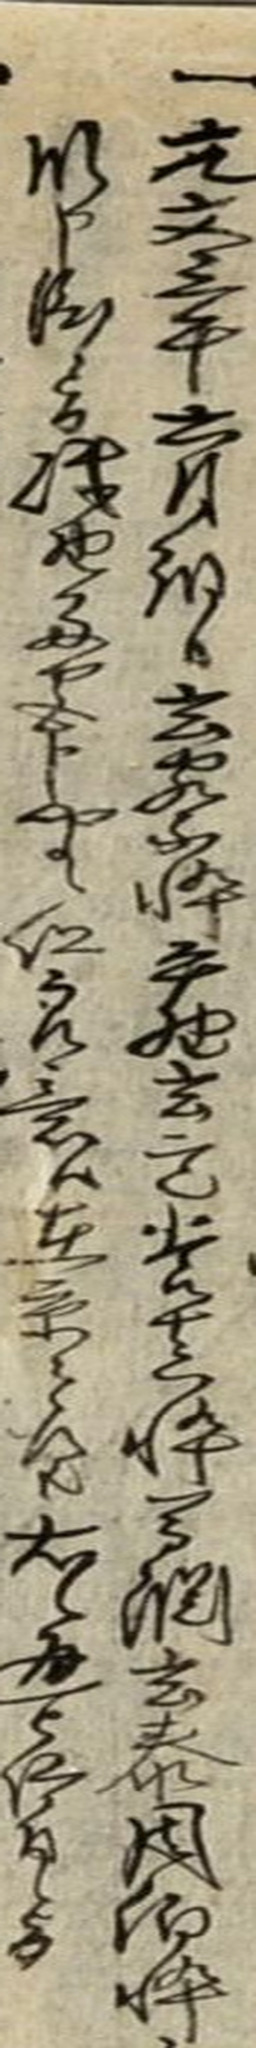段申渡候旨磯野多宮申聞候但良意は在京に候得共右之通被仰付候旨
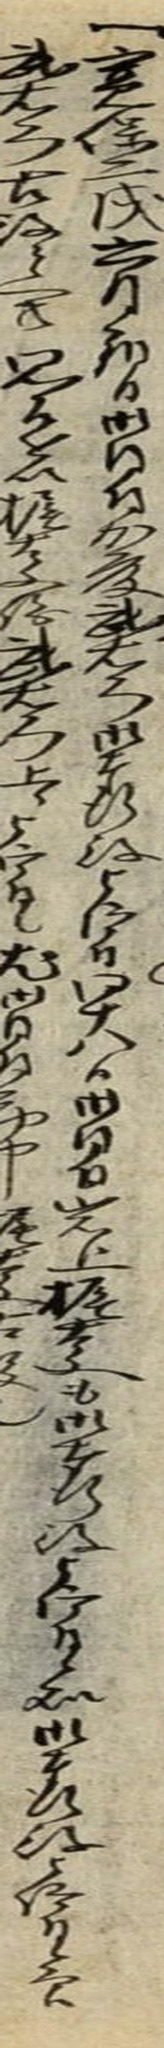一寛保二戌六月朔日御目付加藤武右衛門御奉行役被仰付同十八日御目付岩上梶太夫も御奉行役被仰付候処御奉行役被仰付候而は
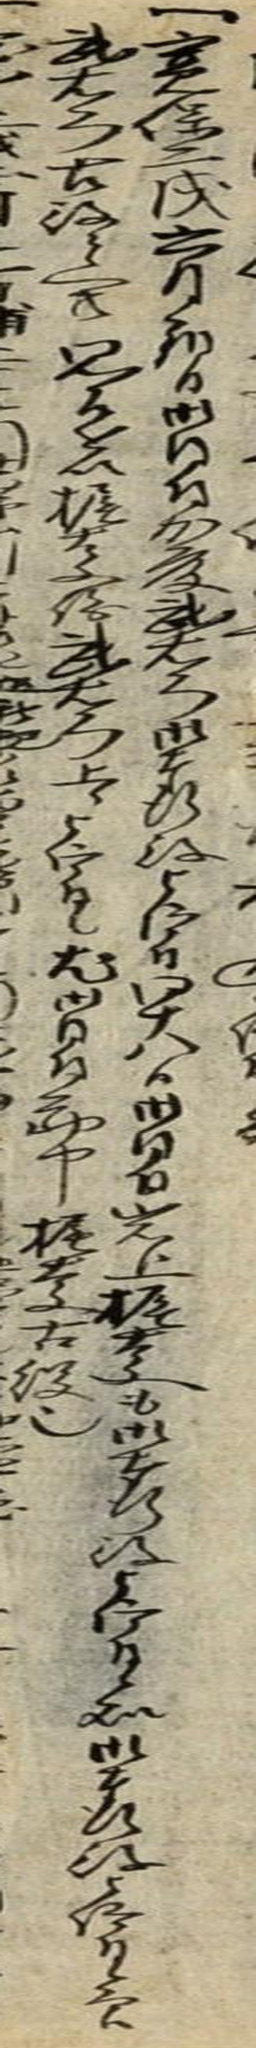武右衛門古役に候へ共思召を以梶太夫儀武右衛門上へ被仰付候尤御目付勤中梶太夫古役也
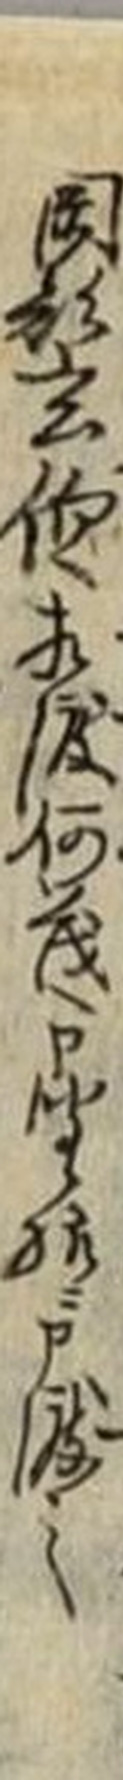岡部玄伯へ相渡何もへ申聞候様に申渡之
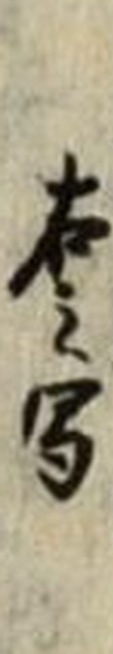右之写
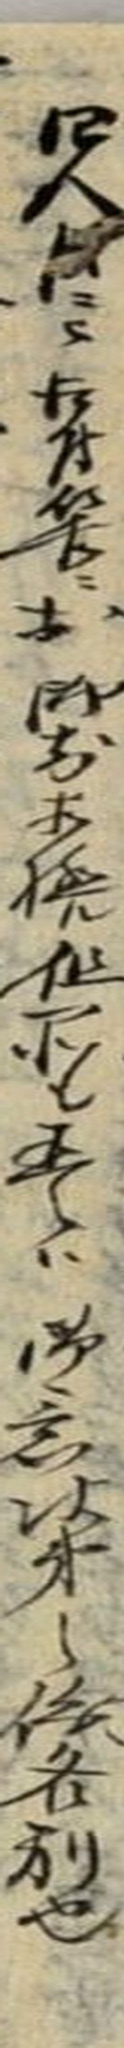四人目に被仰付候筈に於御前相極ル但品も有之候は御意次第之儀各別也
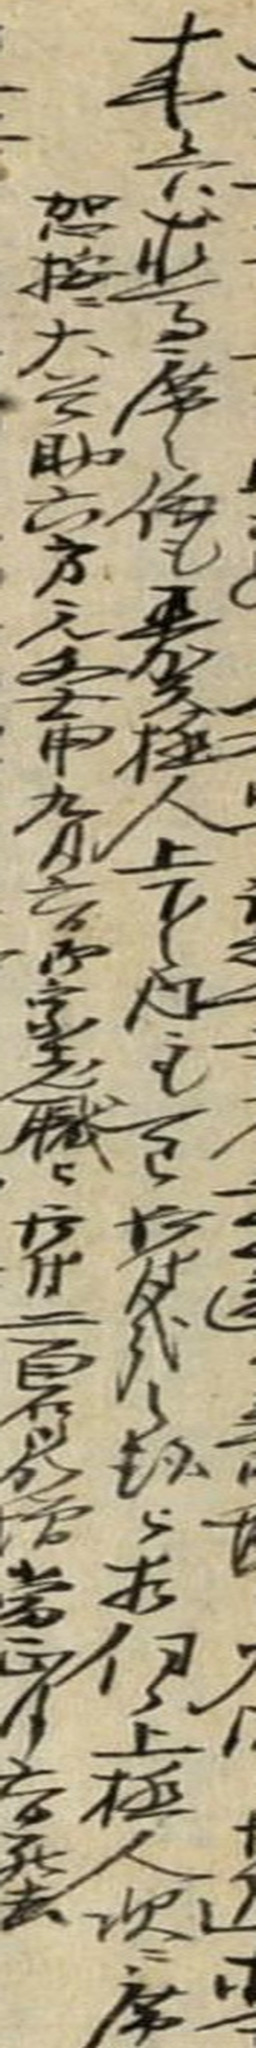恕按ニ大谷助六元文五申九月六日御家老職被仰付二百石御加増当正月六日死去
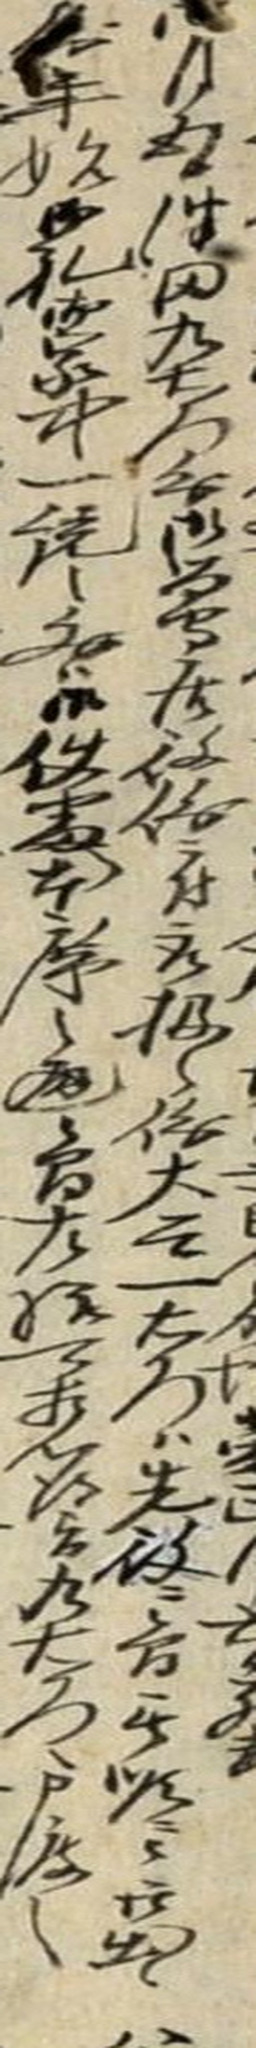外之儀年始御礼御家中一統之文は御使番本席之通候間左様可相心得旨九右衛門へ申渡之
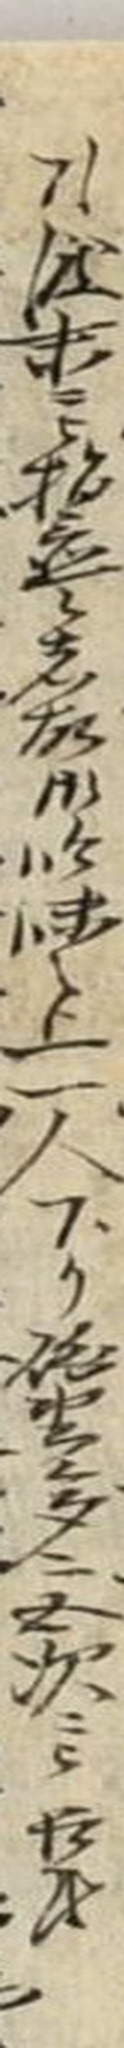引渡末に被指置候者故御吟味之上一人下り磯野多宮に次に被仰付
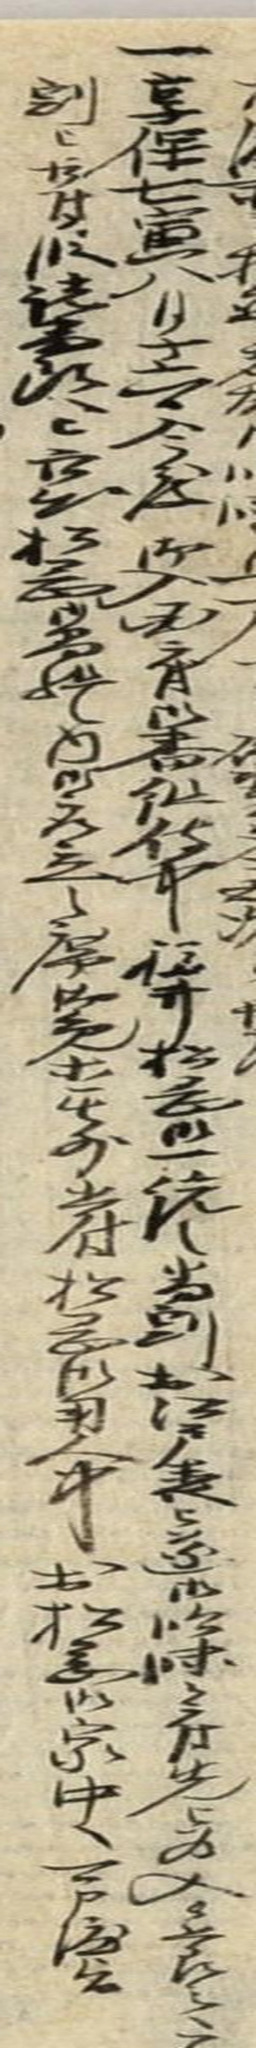割被仰付候段諸番頭へ被仰出松岡御番組之内御取立之席御免等其外書付松岡御用人中於松岡御家中へ可申渡旨
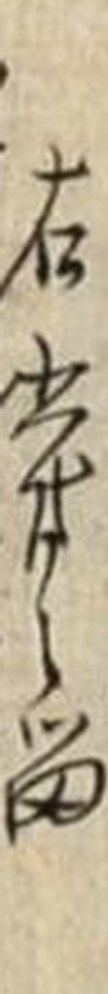右書付之留
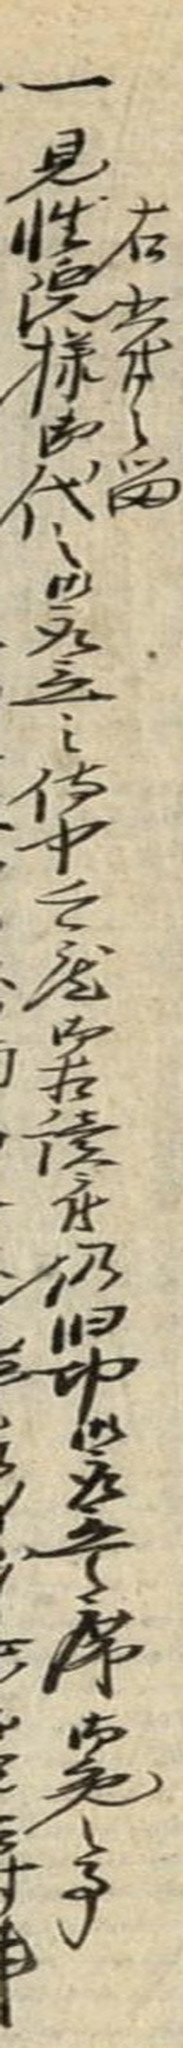一見性院様御代之御取立之侍中今度御相続に付仍旧功御取立之席御免之事
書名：御用并被仰出之部
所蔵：福井県文書館 Fukui Prefectural Archives
